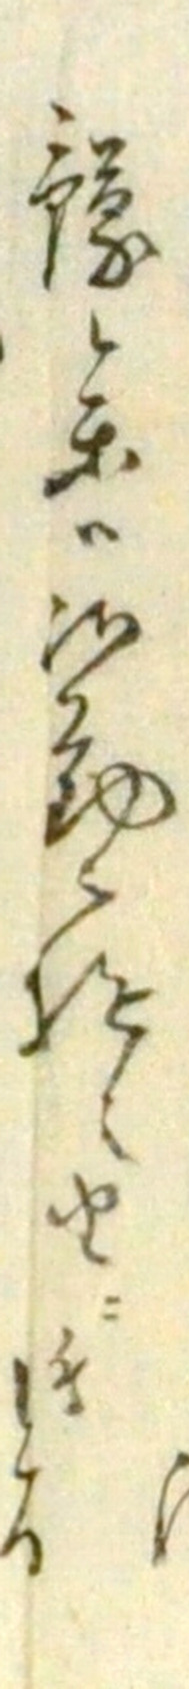予参ハ御勤被遊候由ニ付候間
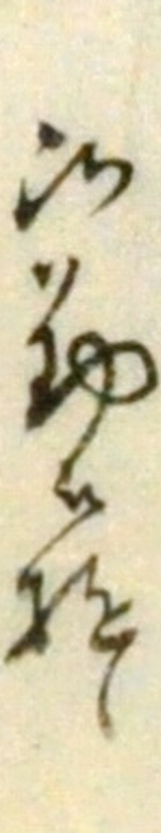御勤被遊候
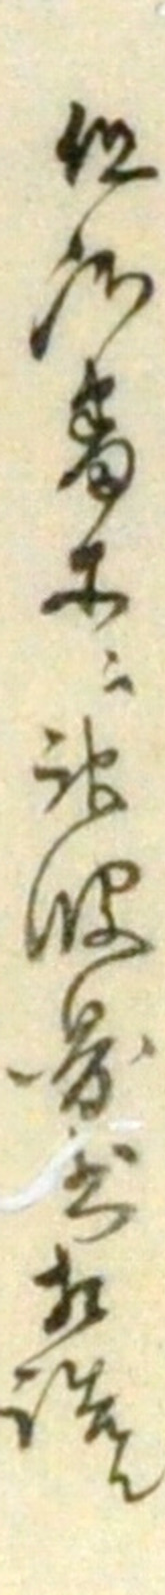但御番所江神波図書相詰ル
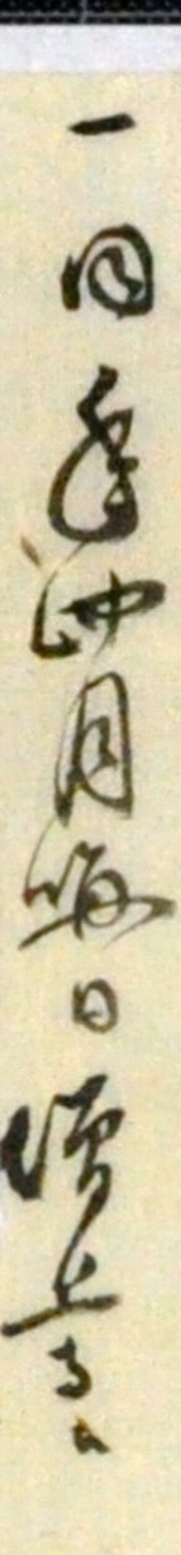一同年四月晦日増上寺江
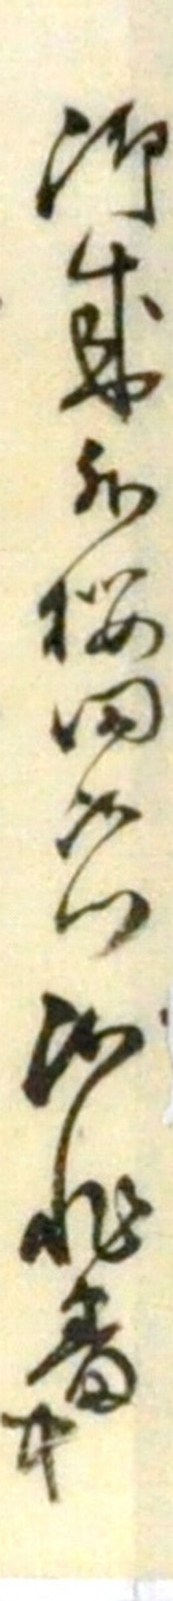御成外桜田御門御非番中
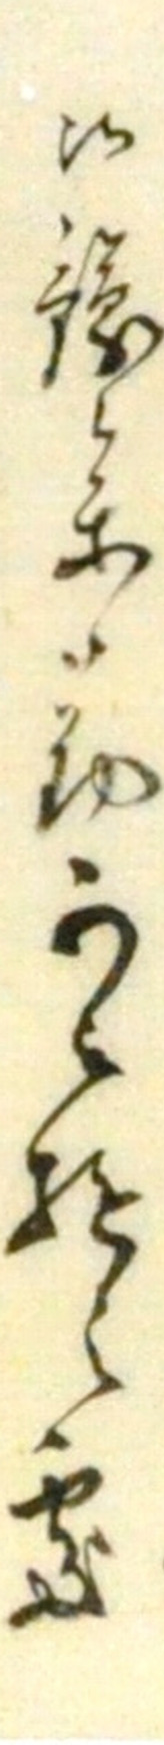御予参御勤可被遊之處
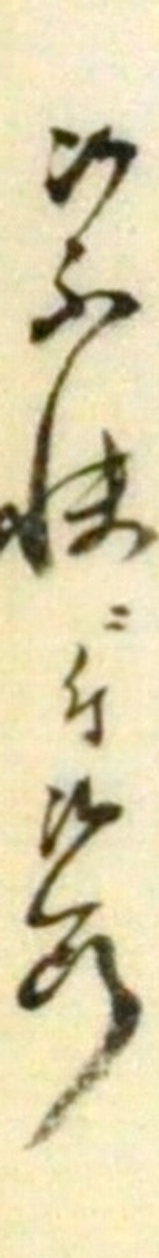御不快ニ付御断
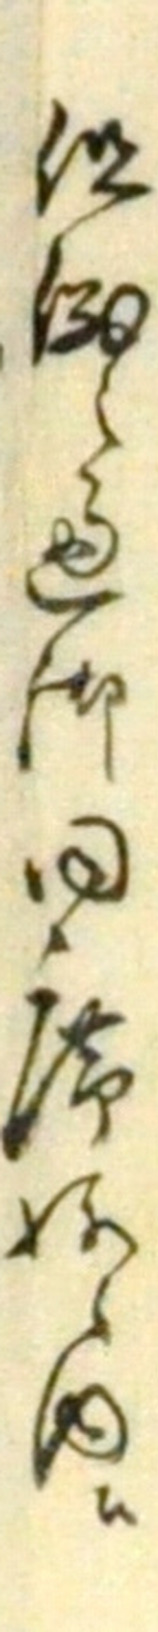但例之通御同席様之内江
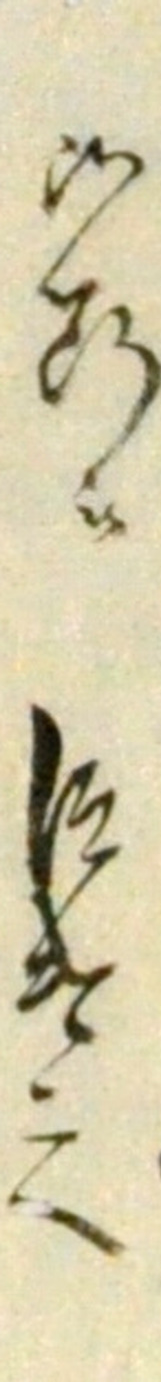御断被仰遣之
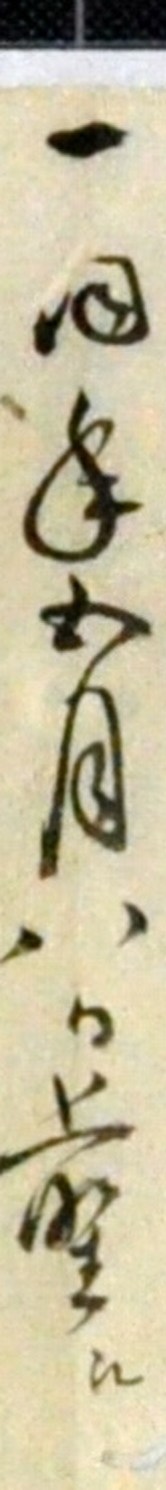一同年五月八日上野江
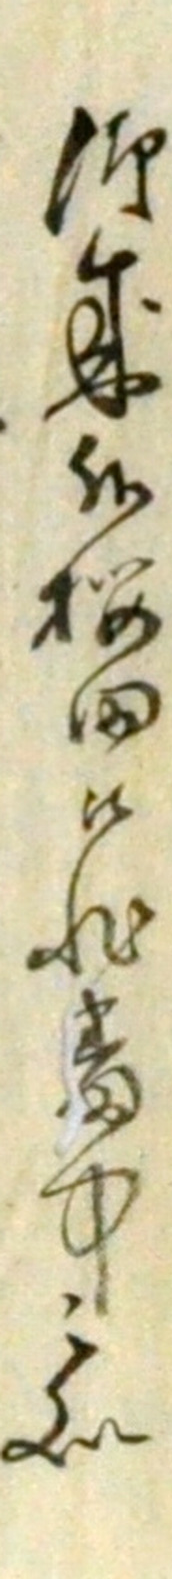御成外桜田御非番中之処
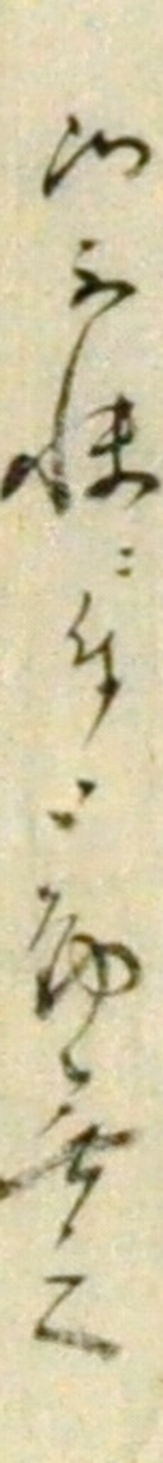御不快ニ付御勤無之
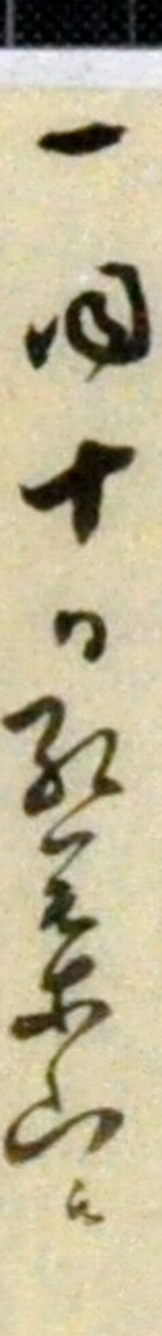一同十日紅葉山江
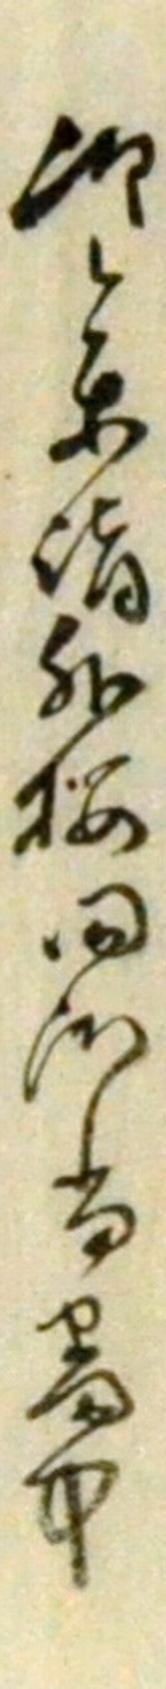御参詣外桜田御当番中
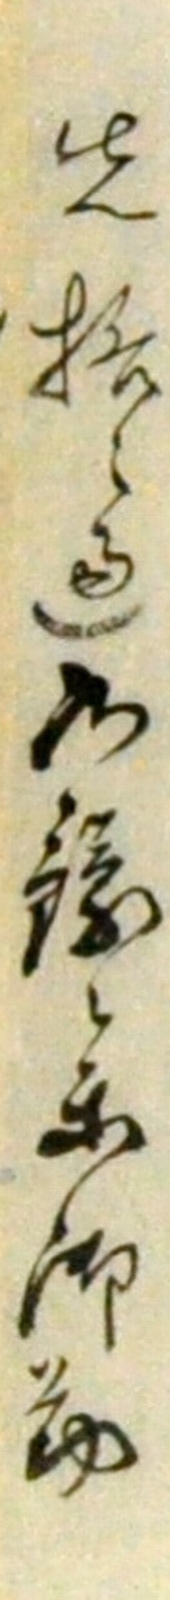先格之通御予参御勤
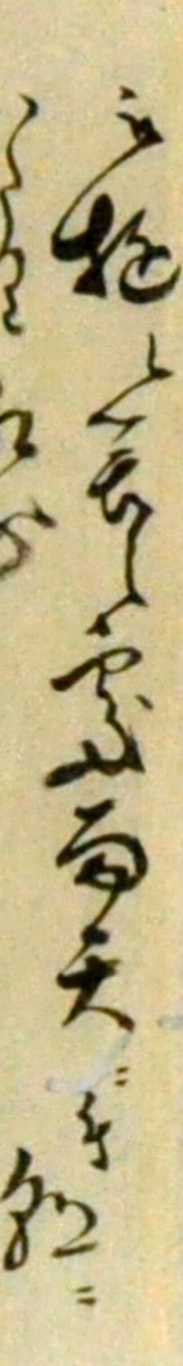被遊候筈之處雨天ニ付朝ニ
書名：覚
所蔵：伊那市立高遠町図書館・合同会社AMANE
